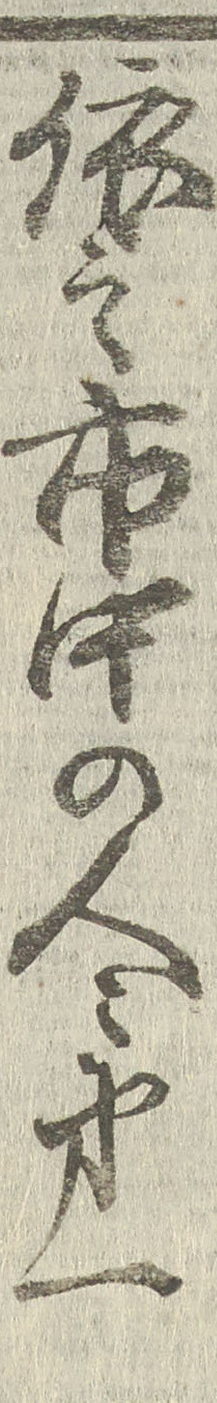依之市中の人々第一
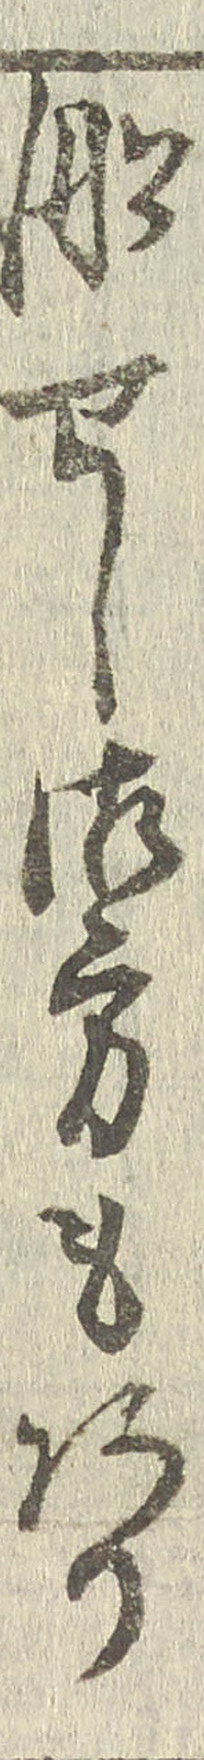船せし御方もあり
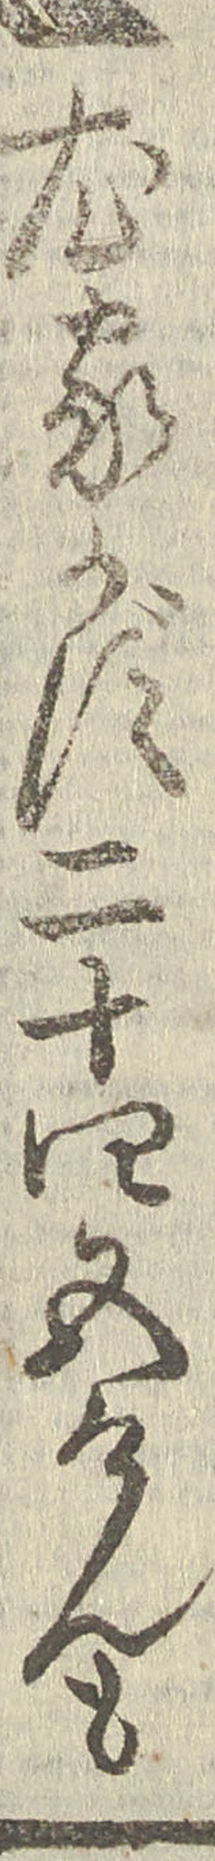尤家かず二十四五けんも
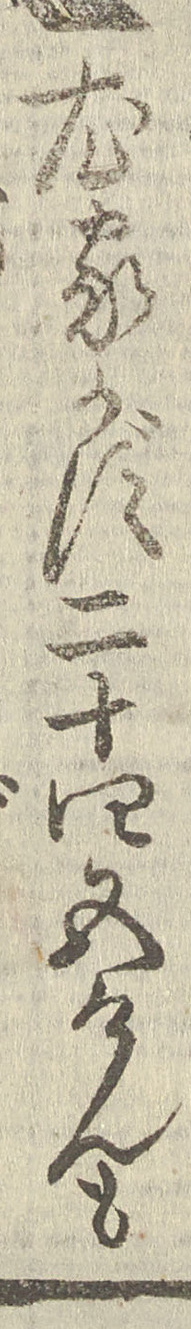尤家かず二十四五けんも
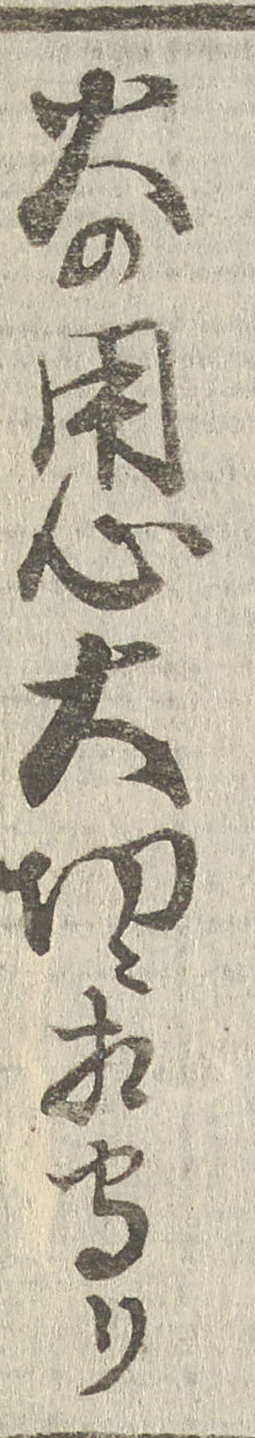火の用心大切に相守り
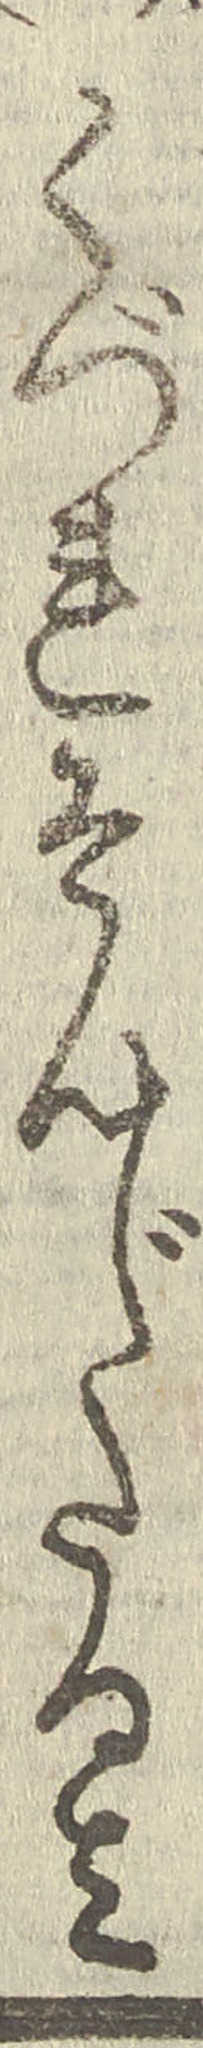くづれそんじたるは
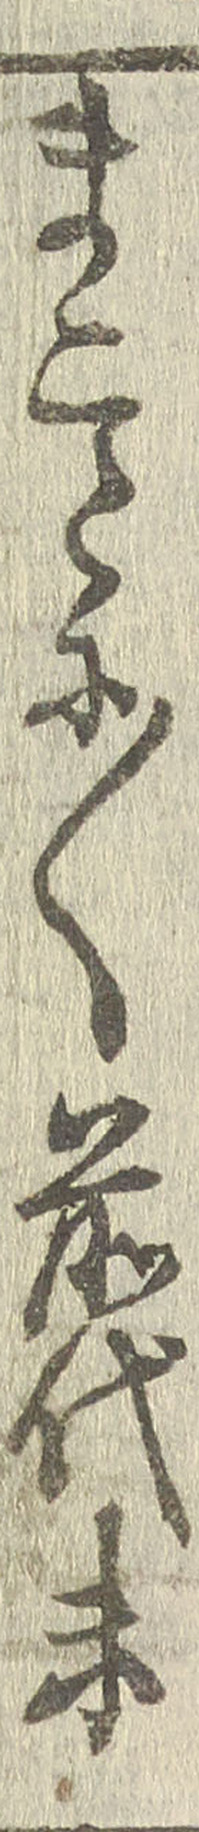まことに〳〵前代未
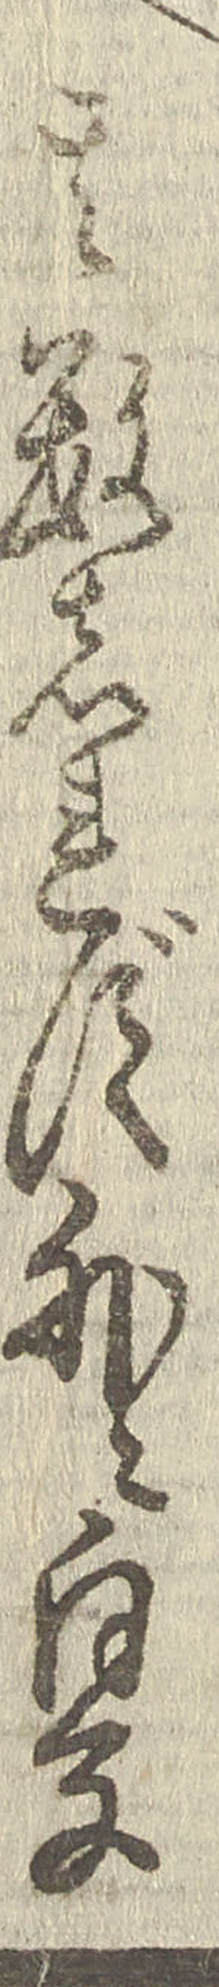其数しれず外に白子
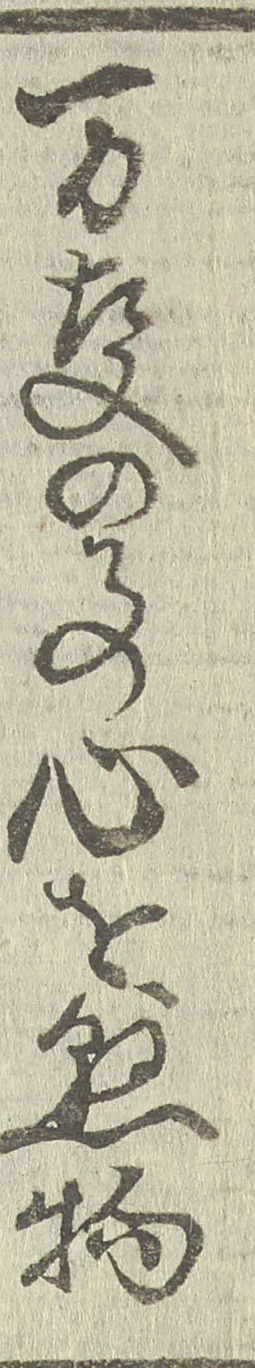万事の事心を懸物
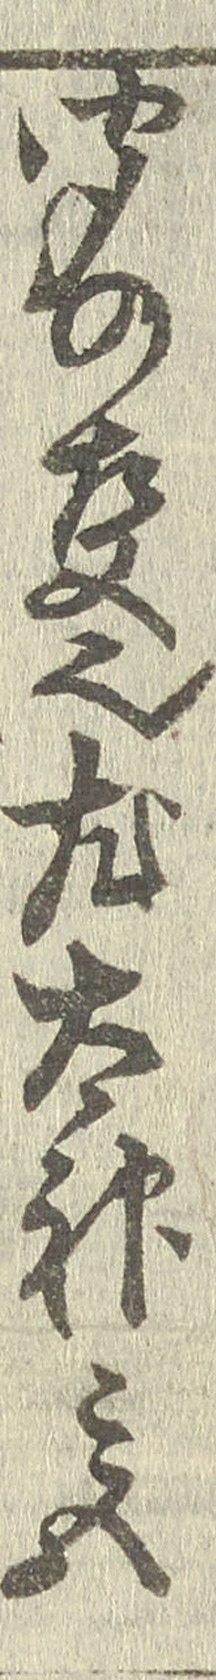聞の事也尤大神宮
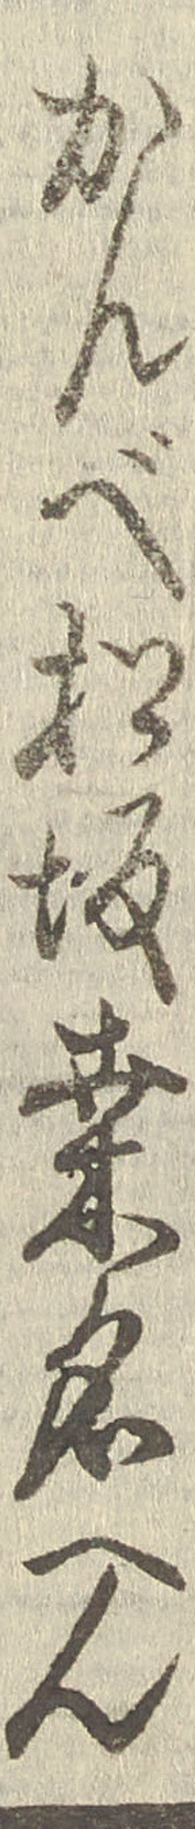かんべ松坂桑名へん
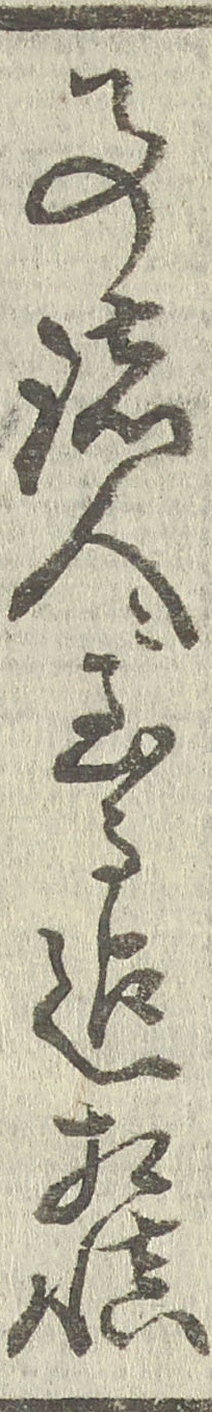事諸人に至る迄相慎
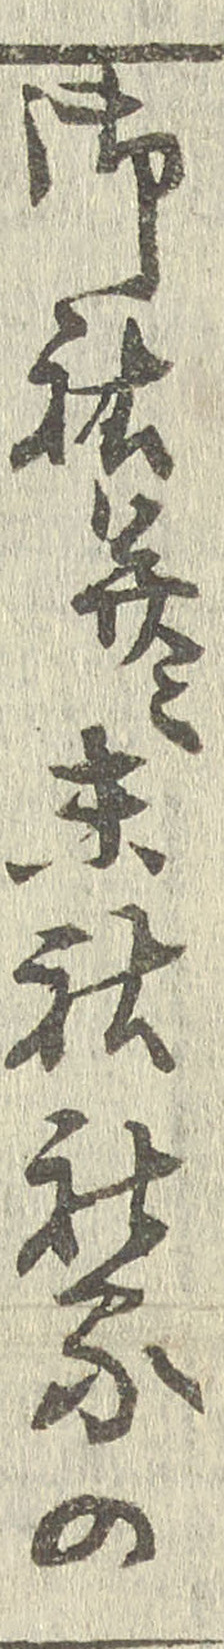御社并に末社社家の
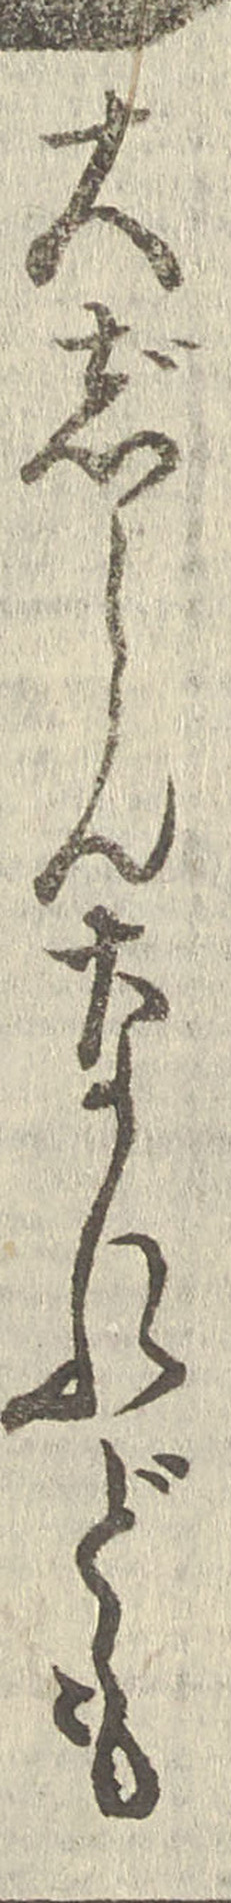だいじしんなれども
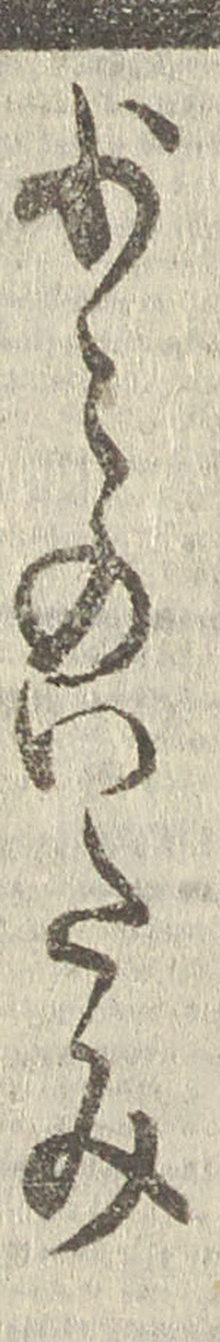少々のいたみ
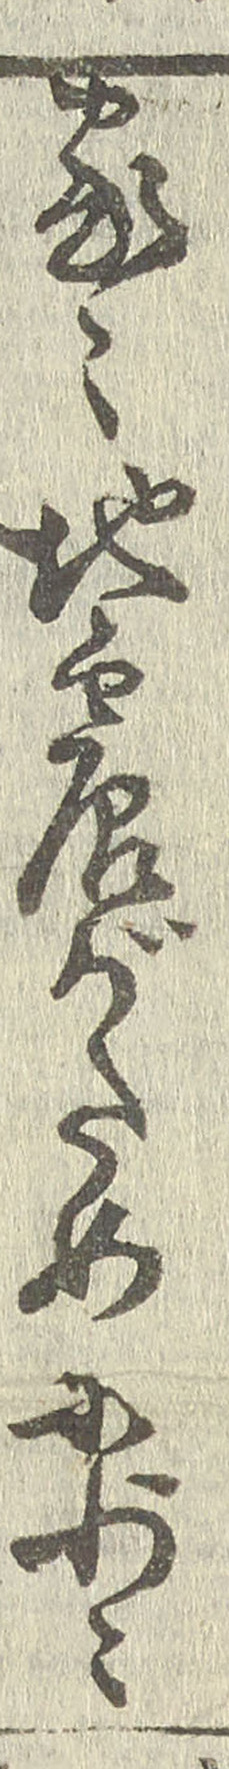家々地震がために少々
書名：諸国大地震大津波 三編
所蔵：東京大学総合図書館 General Library in the University of Tokyo, JAPAN
